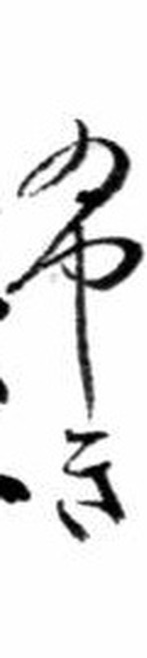ゐやしき
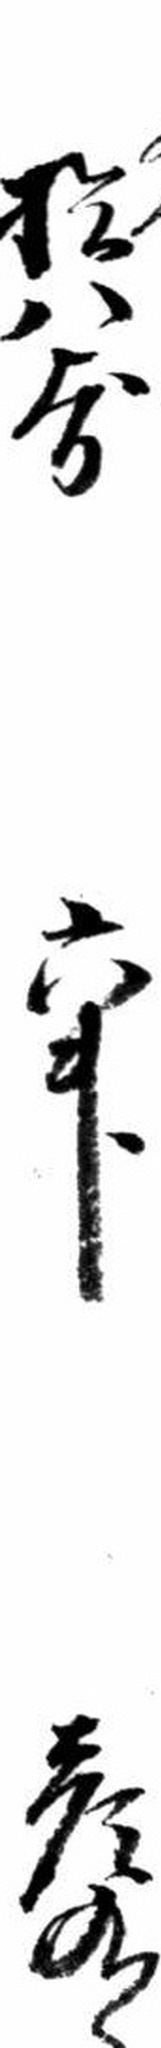拾八歩六升彦九郎
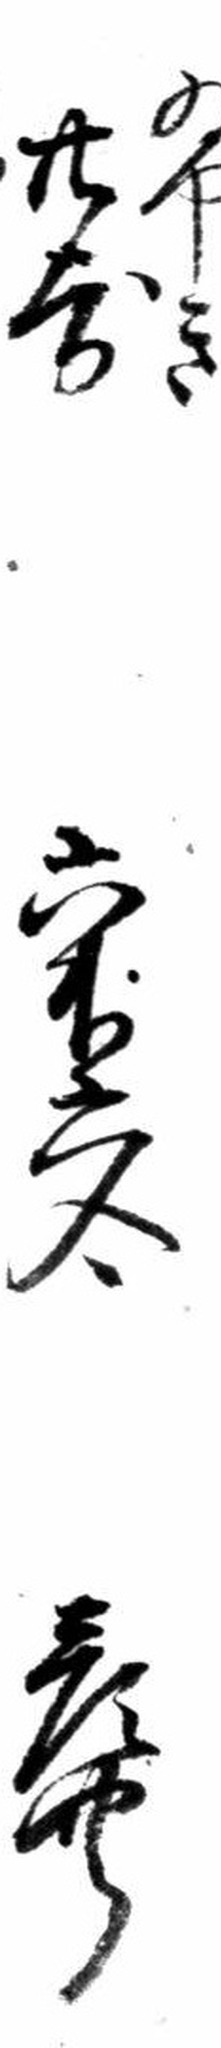廿歩六升六合彦四郎
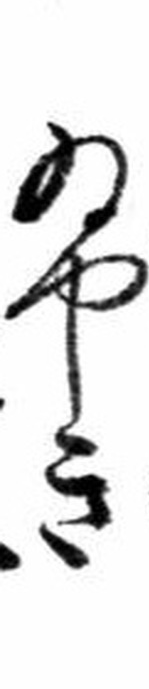ゐやしき
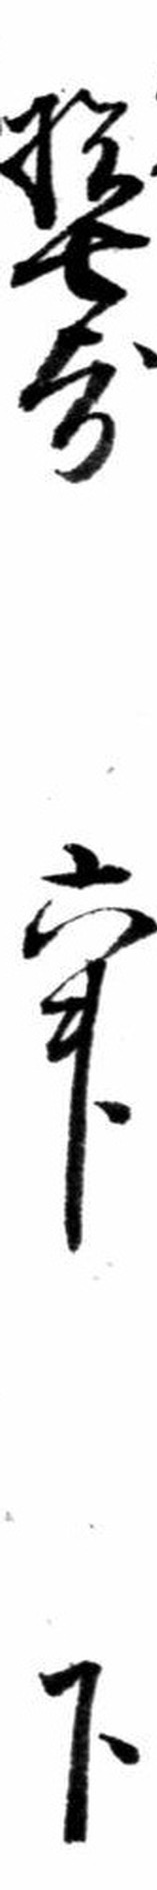拾七歩六升下
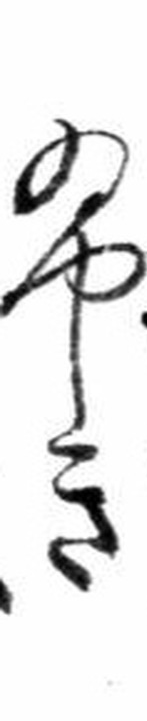ゐやしき

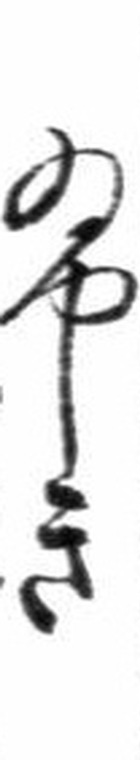ゐやしき
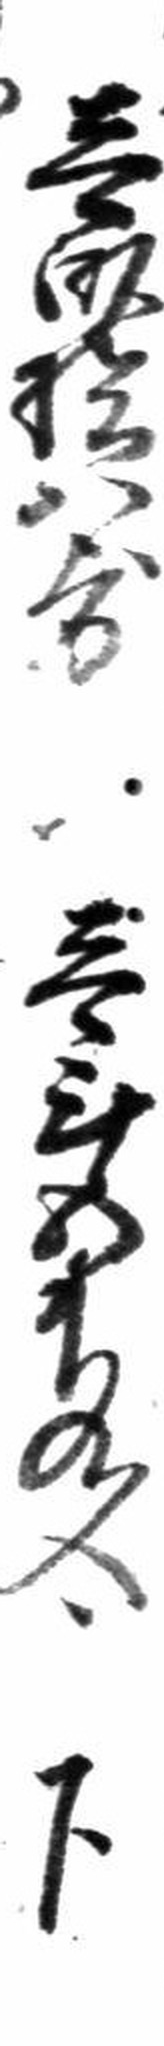壱畝拾八歩壱斗五升九合下
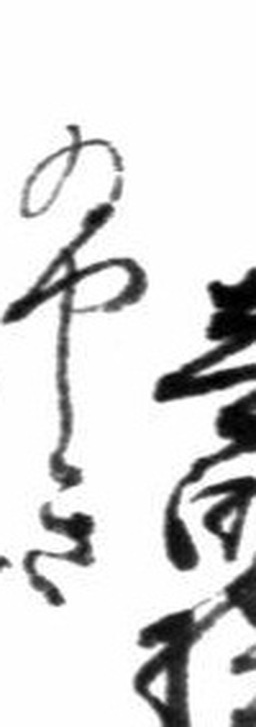ゐやしき
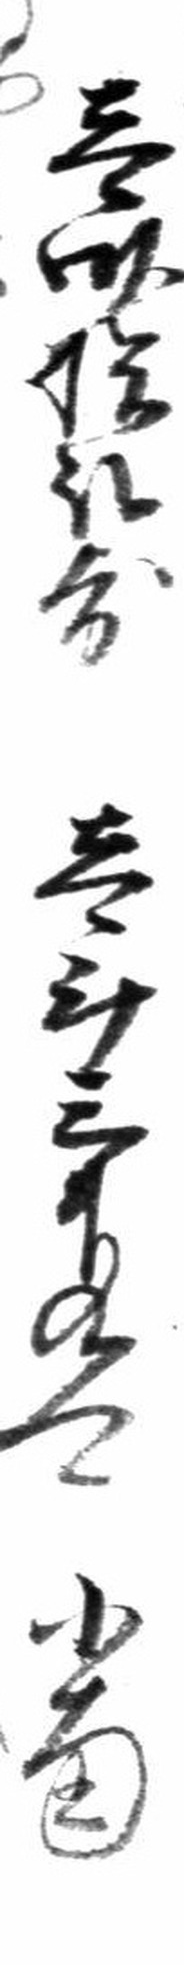壱畝拾弐歩壱斗三升九合小南
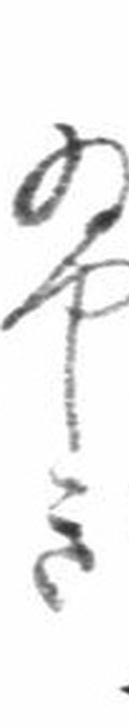ゐやしき
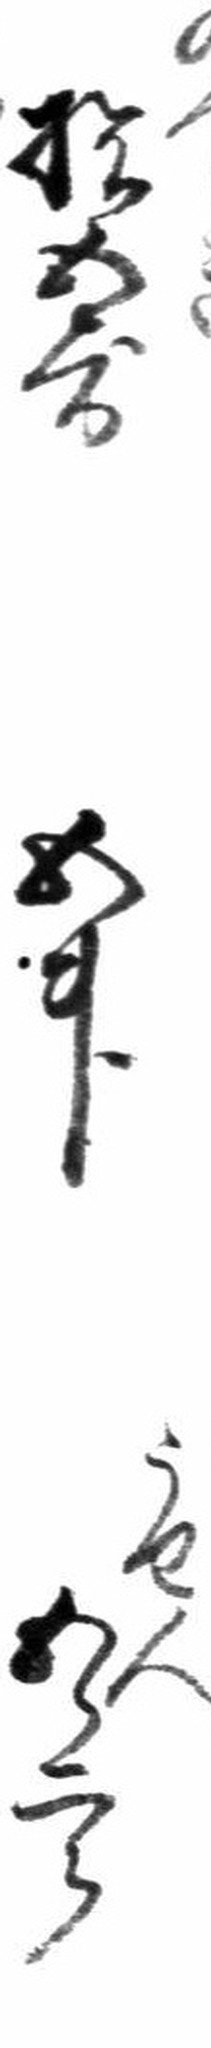拾五歩五升五郎二郎
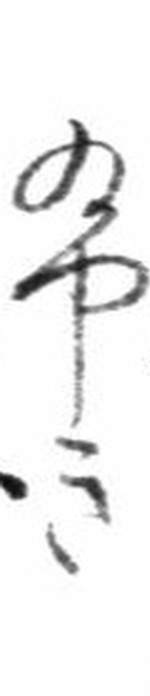ゐやしき
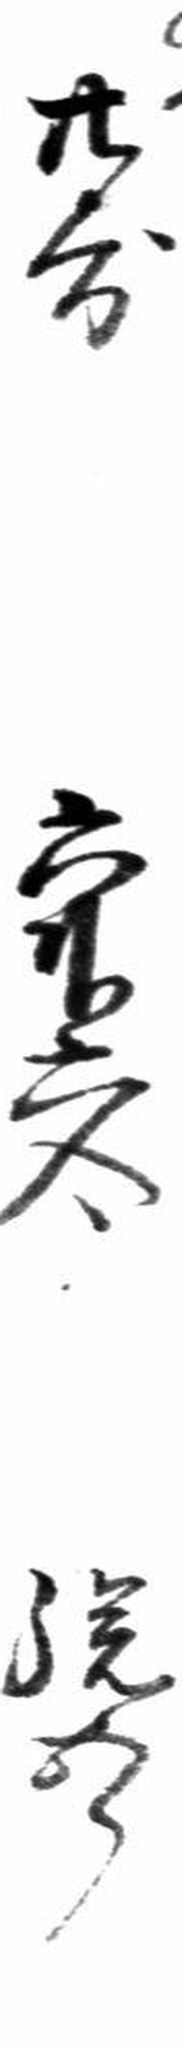廿歩六升六合孫五郎
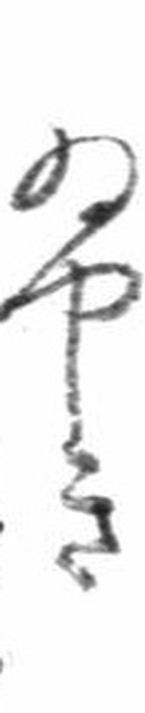ゐやしき
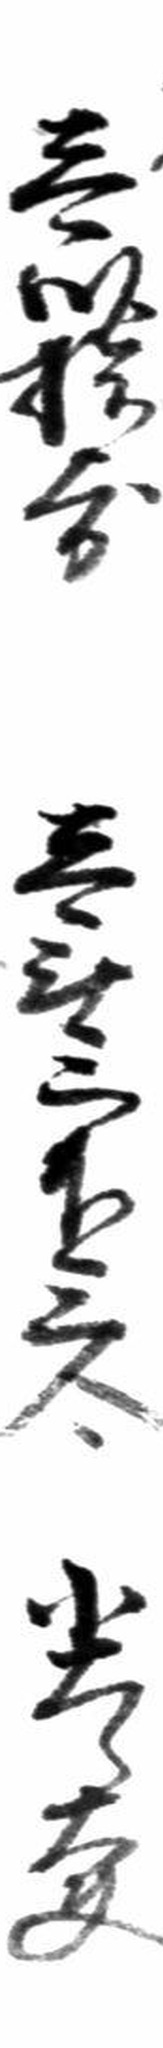壱畝拾歩壱斗三升三合小大郎大夫
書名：若州三方郡之内世久見浦御検地帳（世久見浦検地帳写）
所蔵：福井県文書館 Fukui Prefectural Archives
